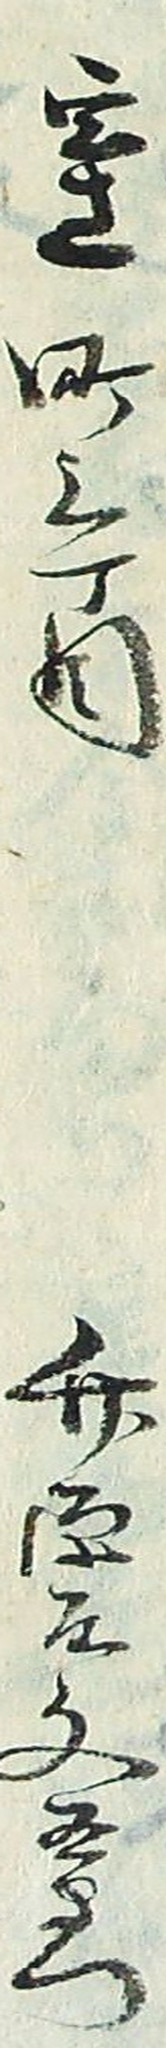室町三丁目竹原屋文右衛門
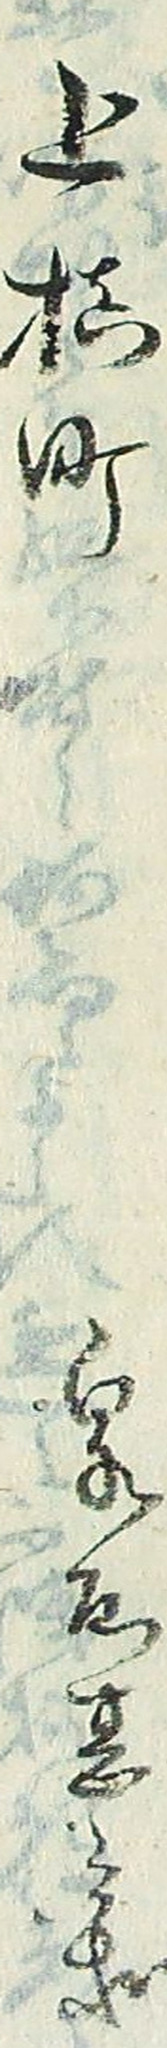上槙町泉屋甚兵衛
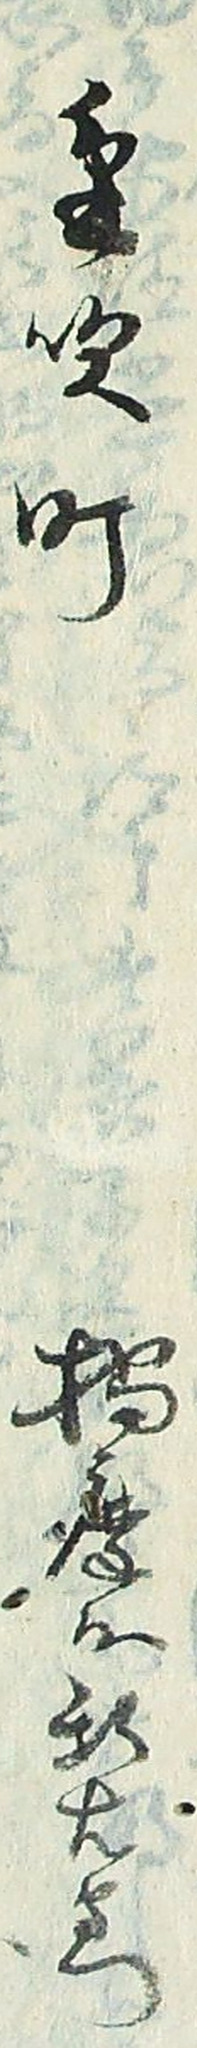金吹町播磨屋新右衛門

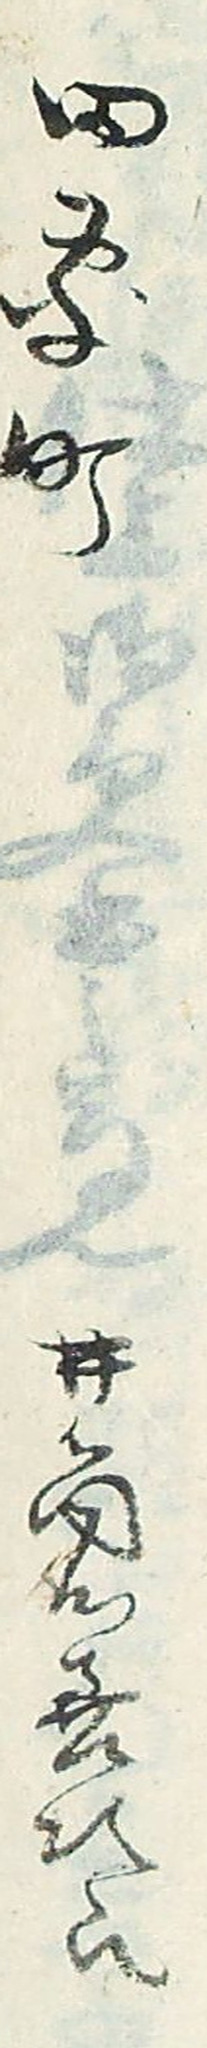田処町井筒屋善次郎
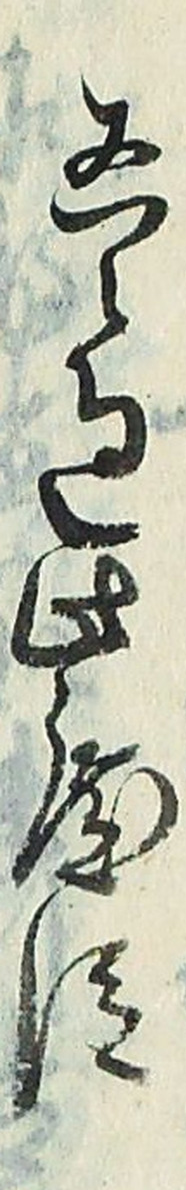右之通此度従
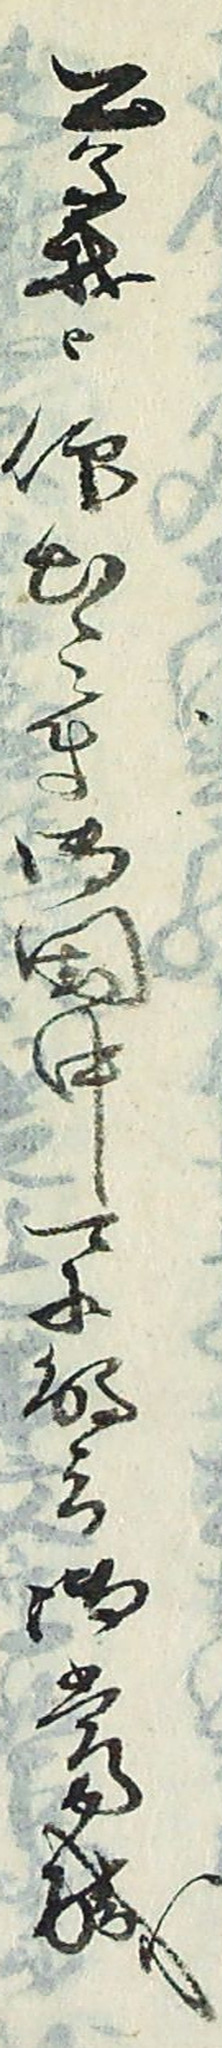公義被仰出候に付御国中可相触旨御当職
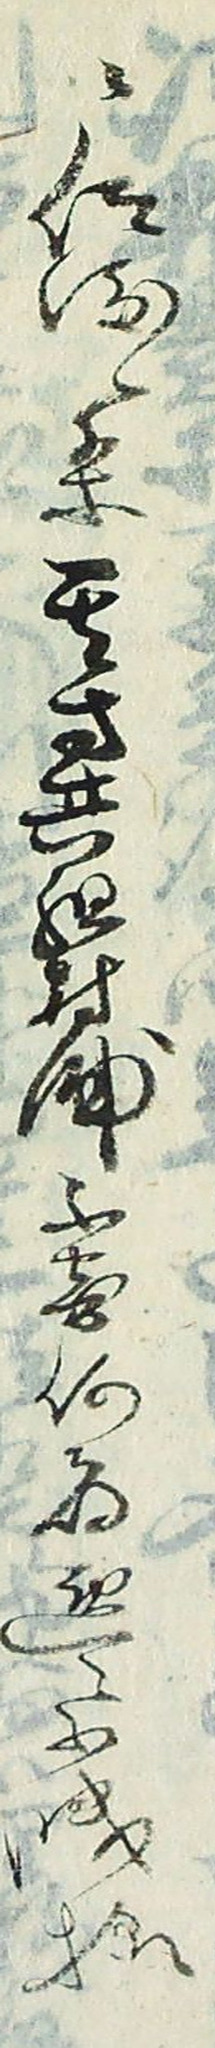被仰渡候条其方共組村浦不寄何者逸々不洩様
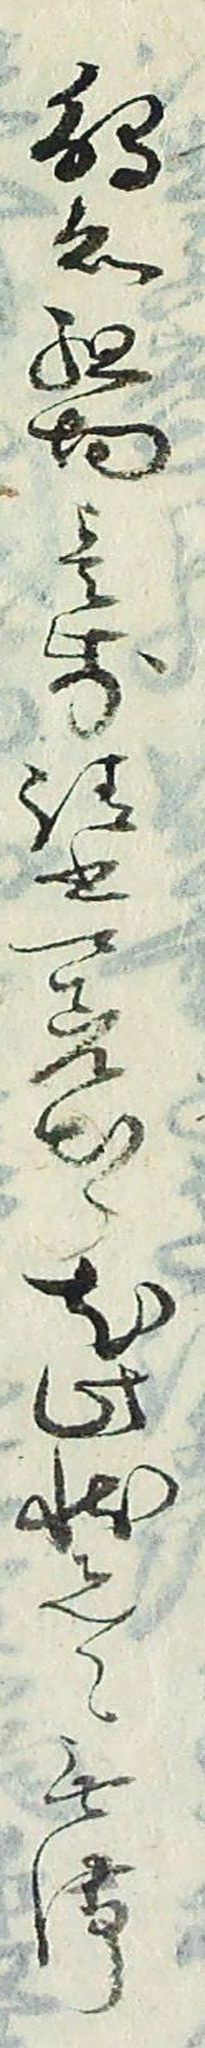触知組切壱帋請書可差出候尤此状先々無滞
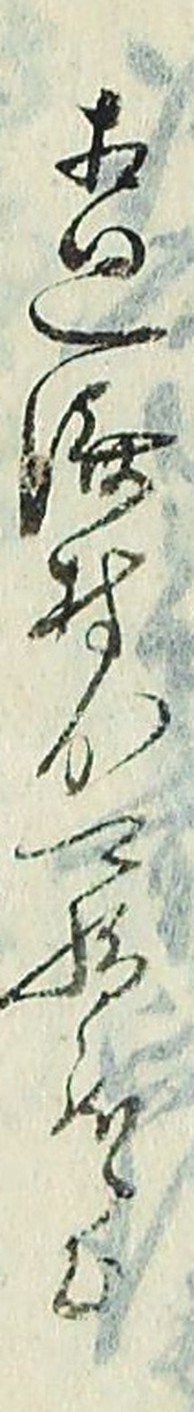相廻済村ゟ可差戻候以上
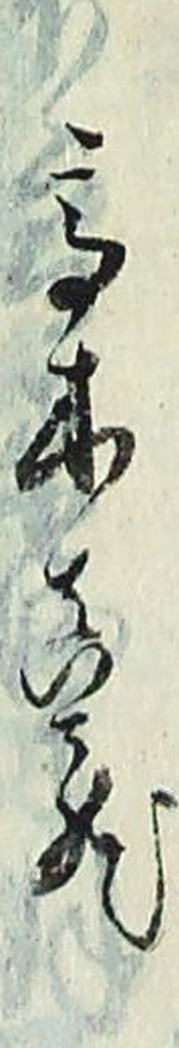高木真蔵
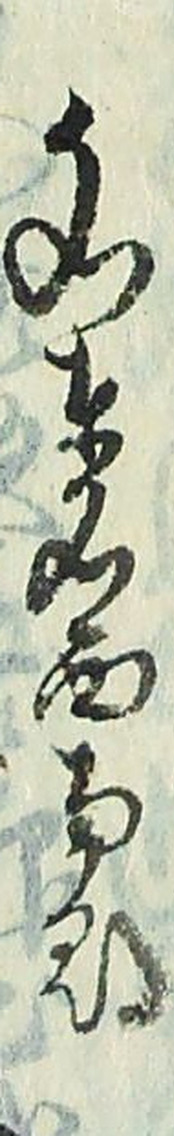名東名西両郡
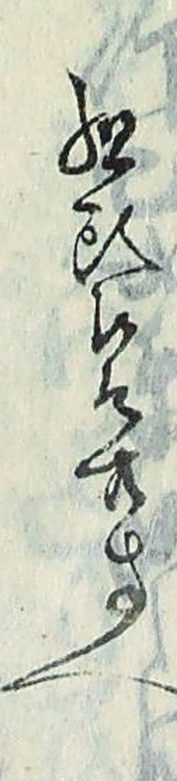与頭庄屋共方へ
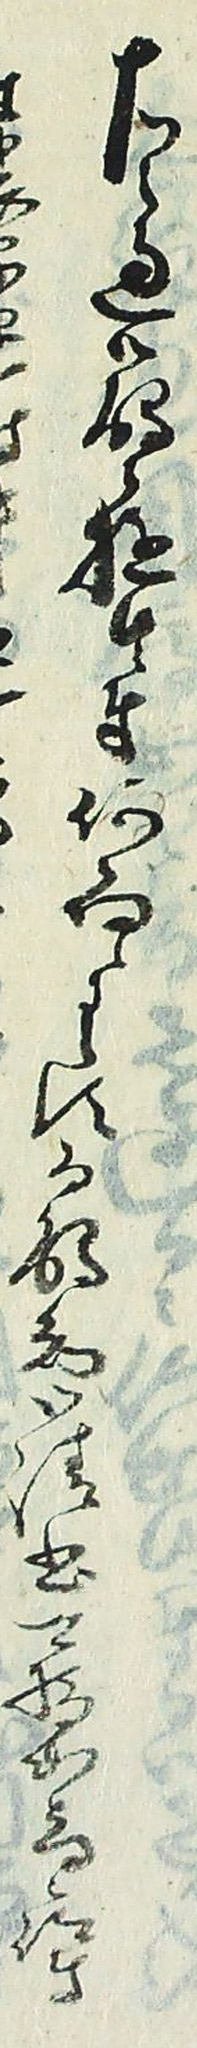右之通御触被遊候に付何者によらす為触知御請書可指出旨被仰付
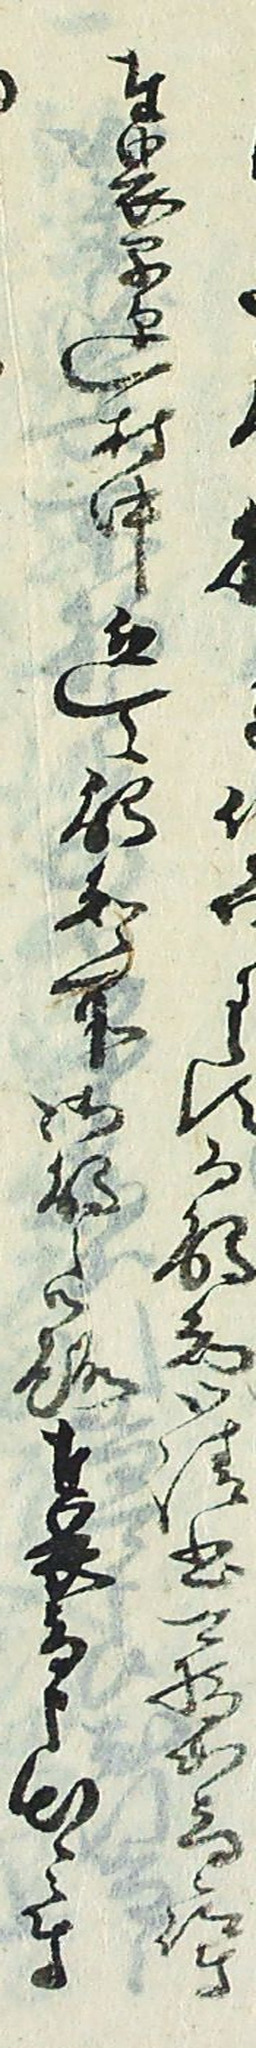奉畏早速村中逸々触知候所御触之御趣奉畏旨申出候に付
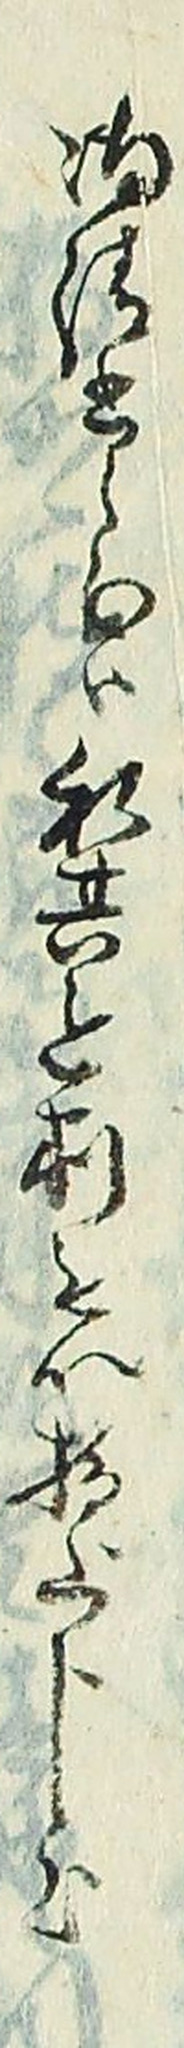御請書之義は私共連判を以指上申候以上
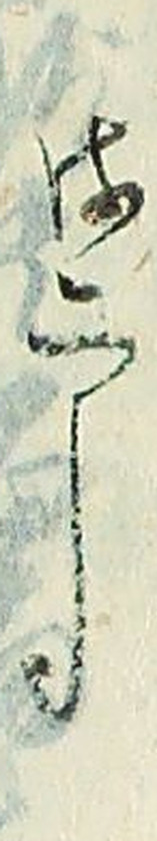戌二月
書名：諸御用御□受書控
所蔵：鳴門教育大学 Naruto University of Education
